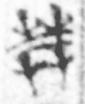𣗥
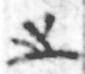之
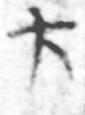大
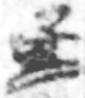爲
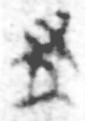○（右）
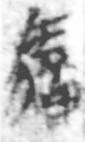○（服）
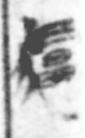驂
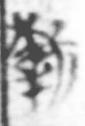新（新）
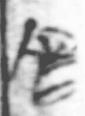官
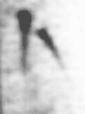人
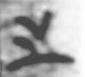之
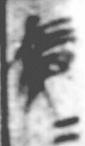駟
